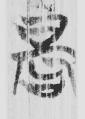晨
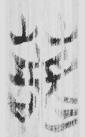{艹若}
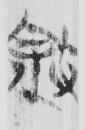敘
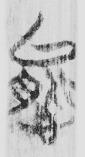態
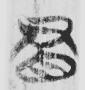冒
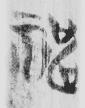神
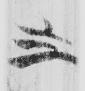之
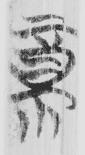福
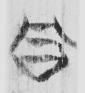同
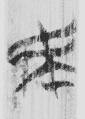民
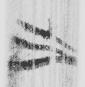之
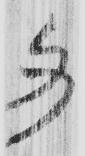力
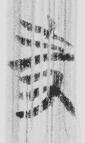寺
